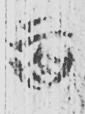百
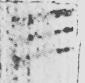三
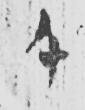千
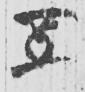五
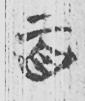百
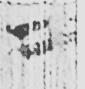二
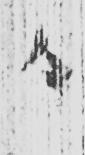千
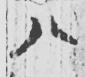八
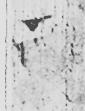百
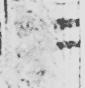二
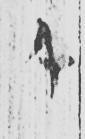千
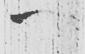一
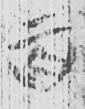百
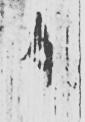千
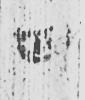四
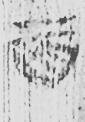百
